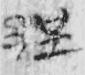郢
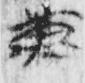黃
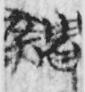鯛
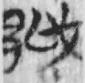○（越）
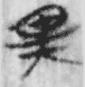異
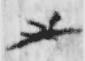之
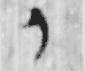人
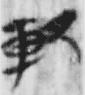○（範）
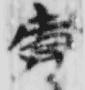賈
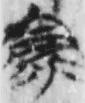彔
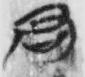君
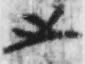之
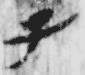子
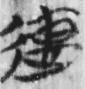連
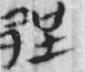郢
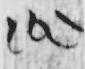州
